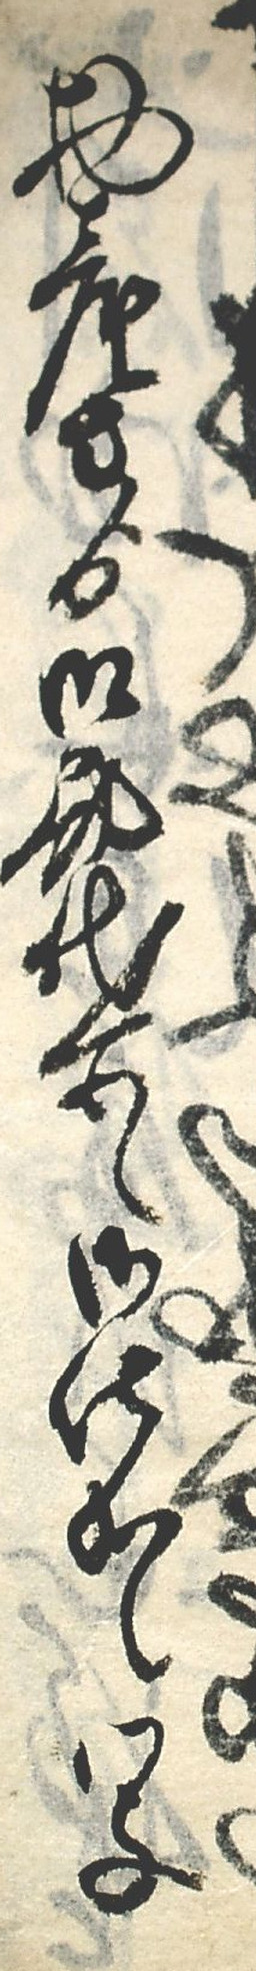物産方ゟ御郡代所へ御被出候写

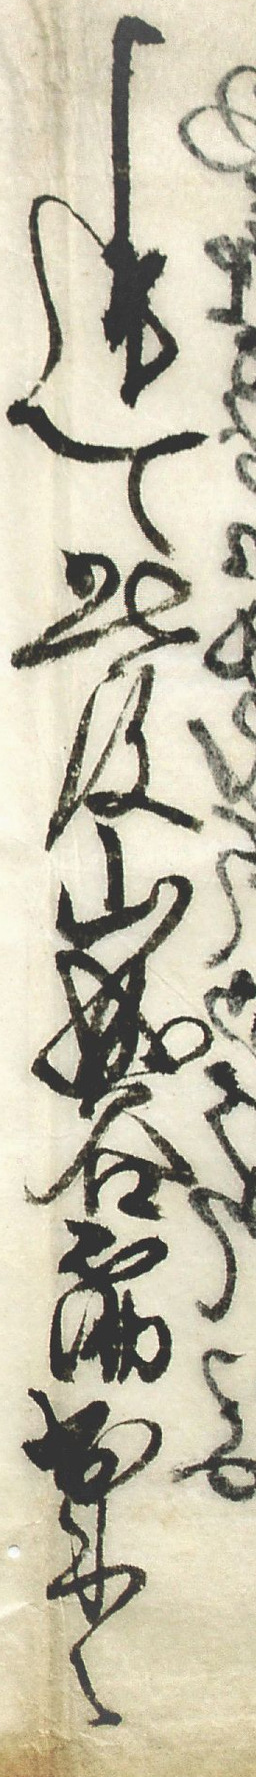申達候此度山城谷筋出来之
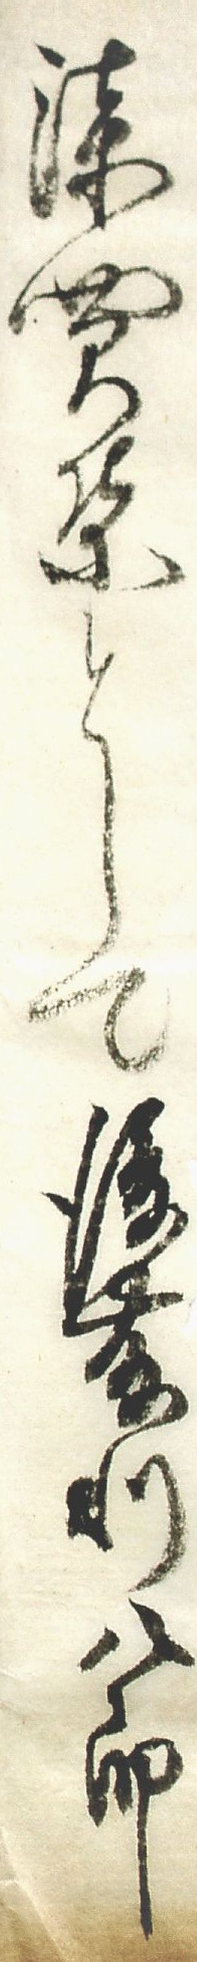漆買集として後藤利八郎
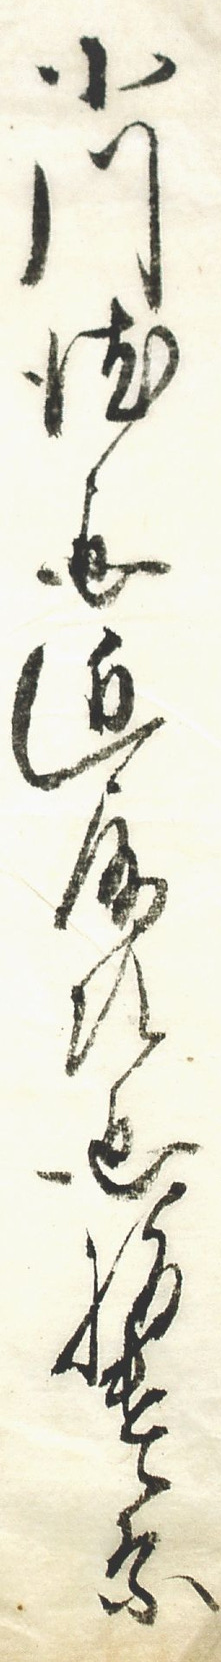小川徳兵衛近藤次兵衛指遣候条
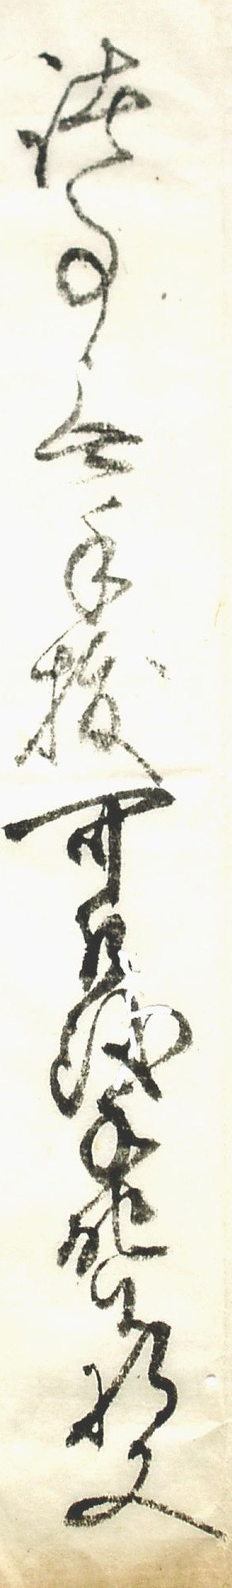諸事無手抜可被致手配候将又
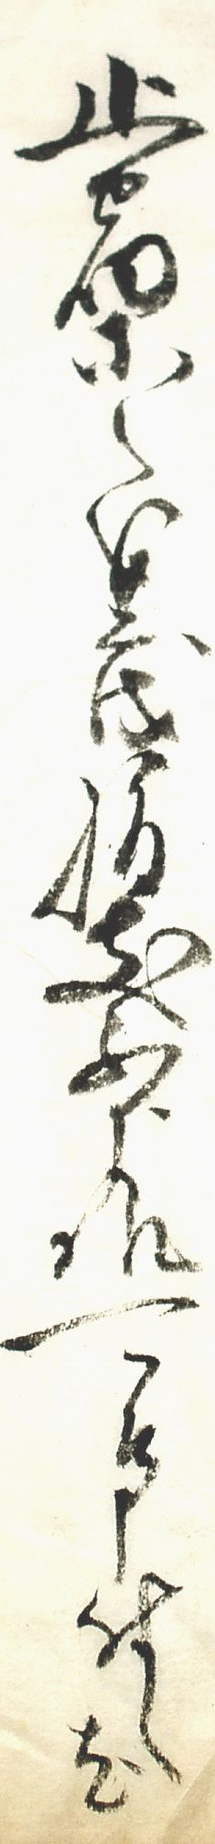止宿等之義も指支不申様可被申付候尤
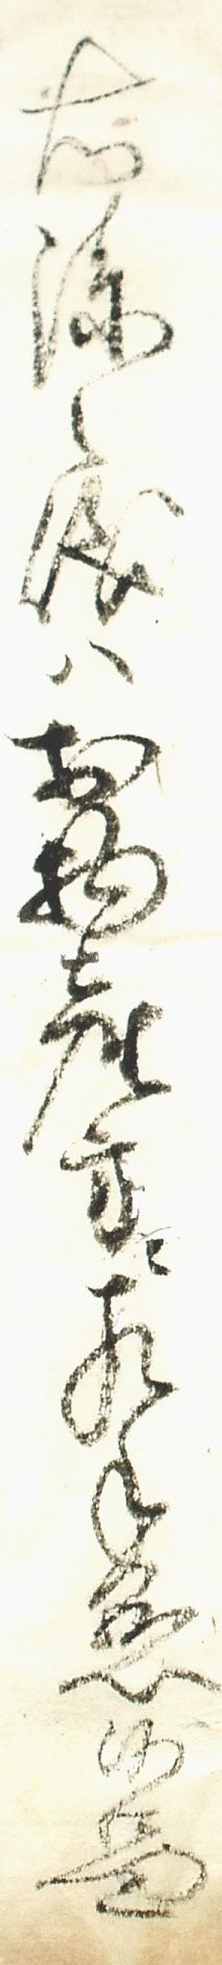右漆之儀は於物産方に相手懸候筈
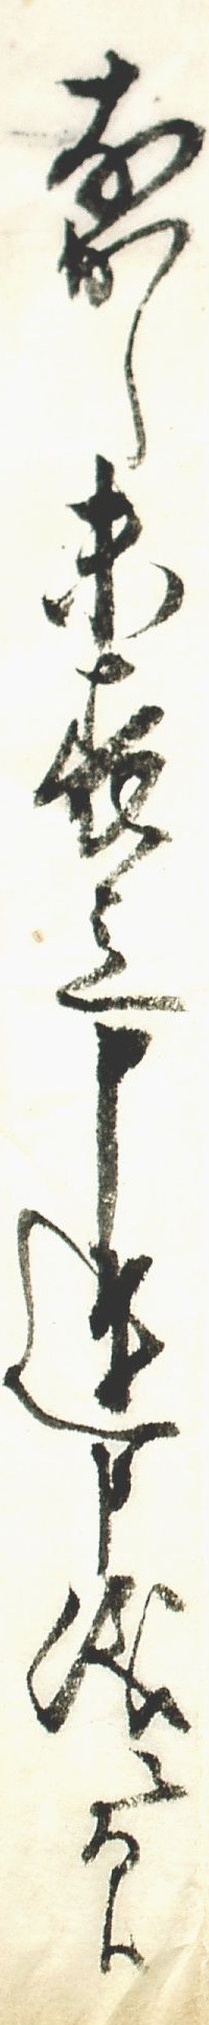ながら未表迄申達申儀に而は
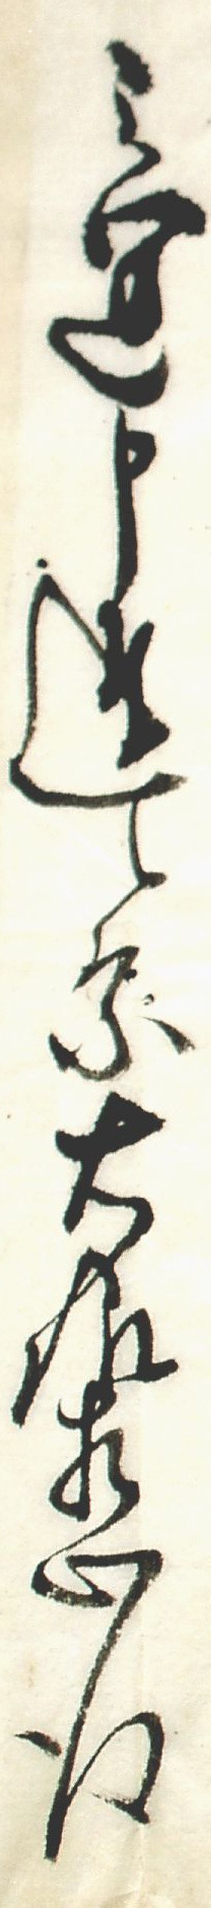之運申達候条右様相心得
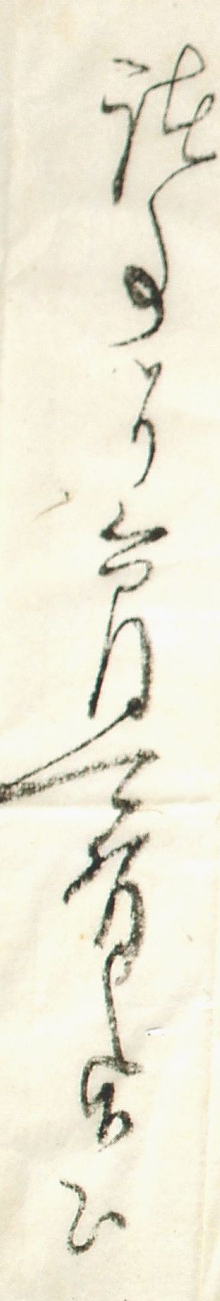諸事了簡可有之候以上
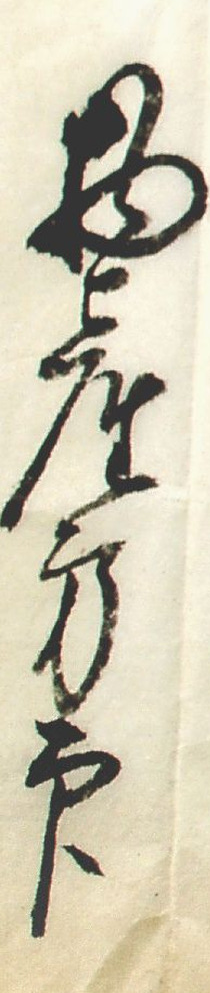物産方印
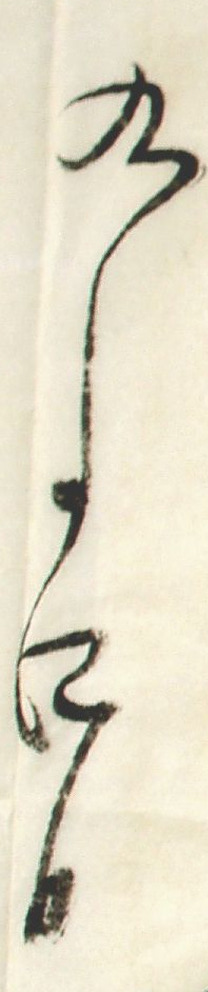九月四日

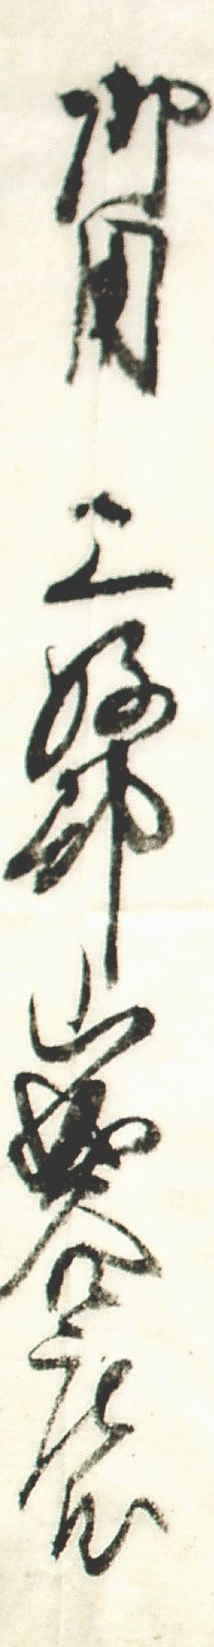御用三好郡山城谷庄屋
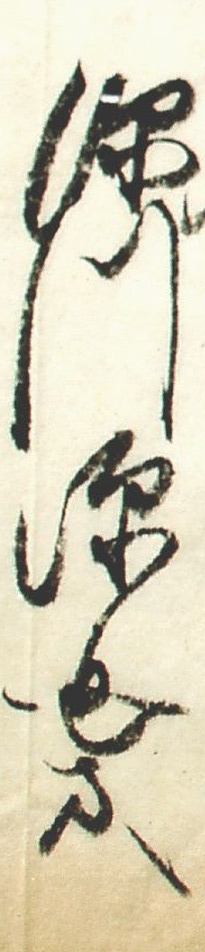深川源兵衛方へ

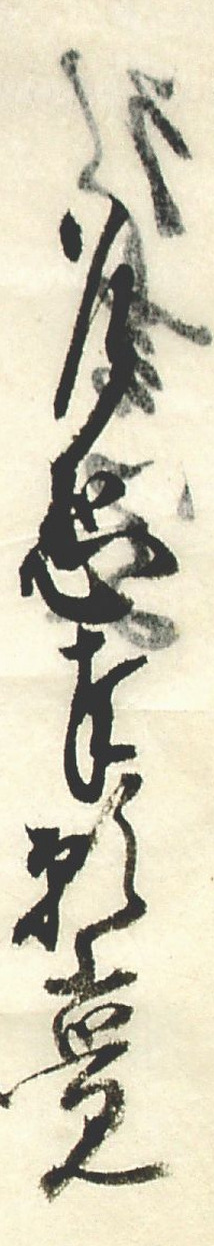乍恐奉願上候覚
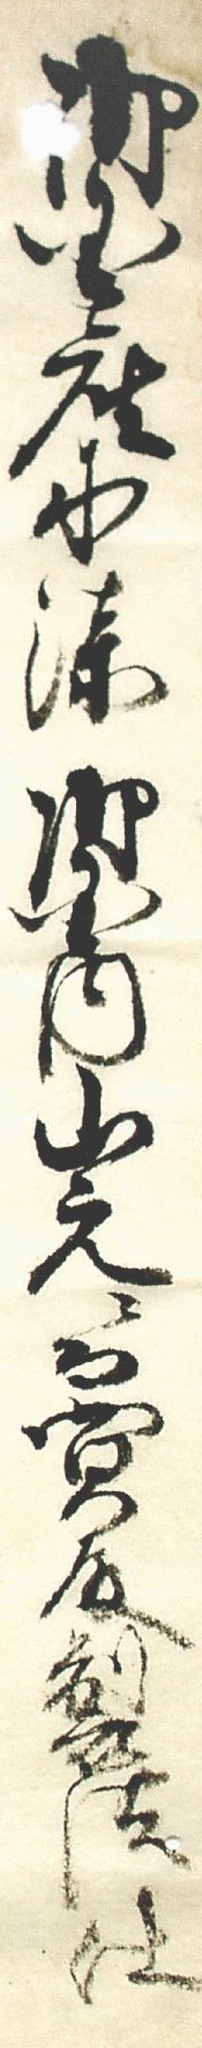御国産木漆御国山元に而買取製法仕
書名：申達（山城谷漆買付役後藤利八郎、小川徳兵衛両名任命）
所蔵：鳴門教育大学 Naruto University of Education
